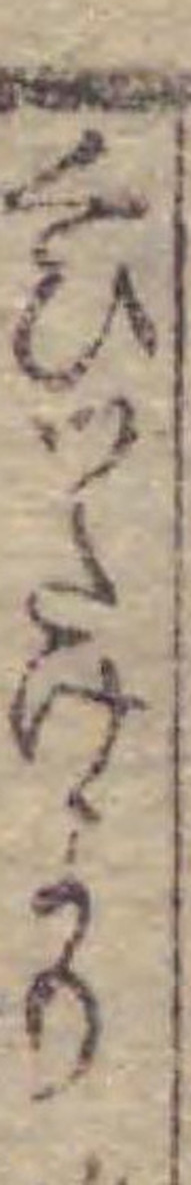くひつたけより
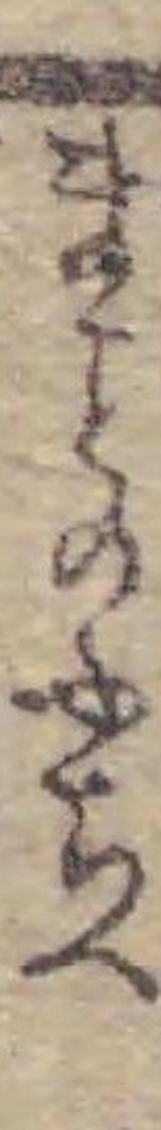まことのふちへ
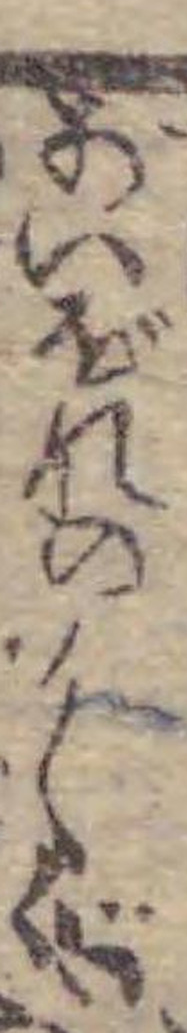あいぼれの
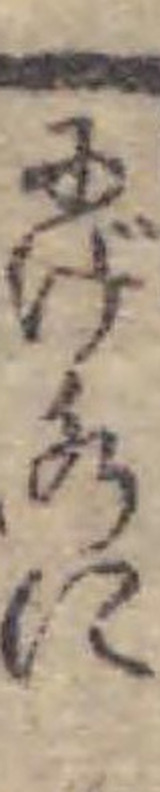にげ水に
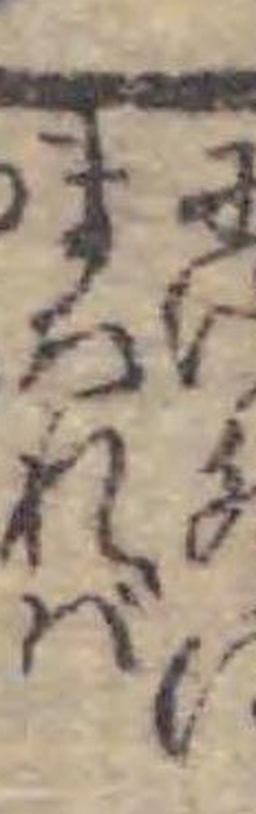まはれば
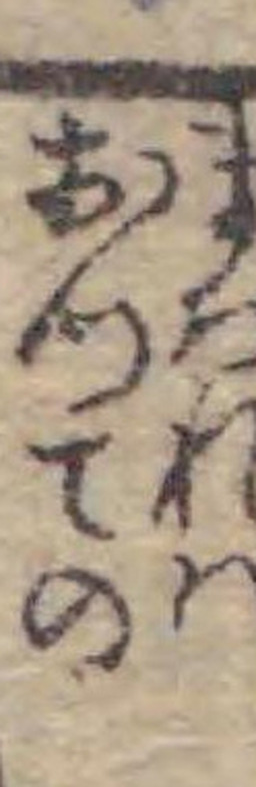おつての
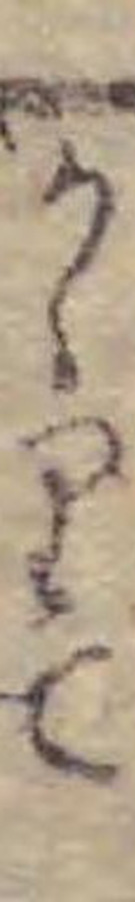かゝりて
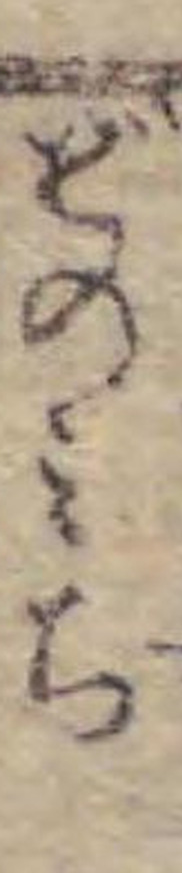どのみち
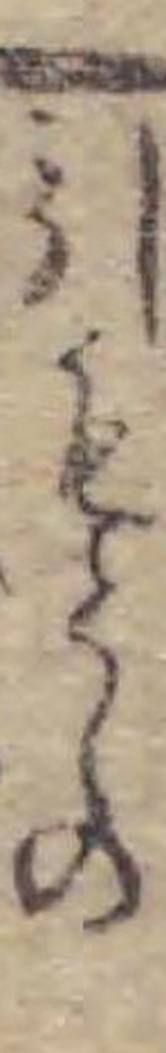引もとしの
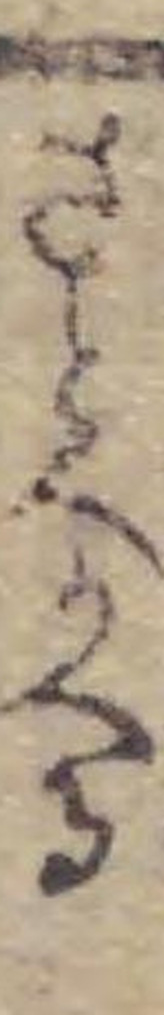さとへかへる
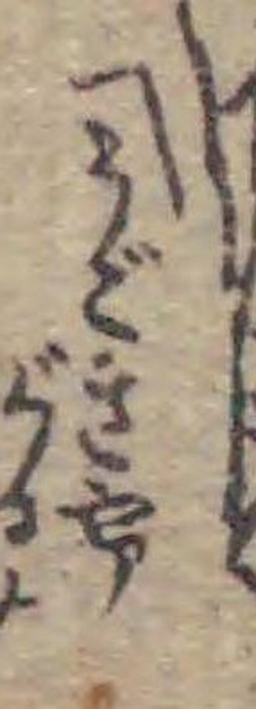〽うごきやァ
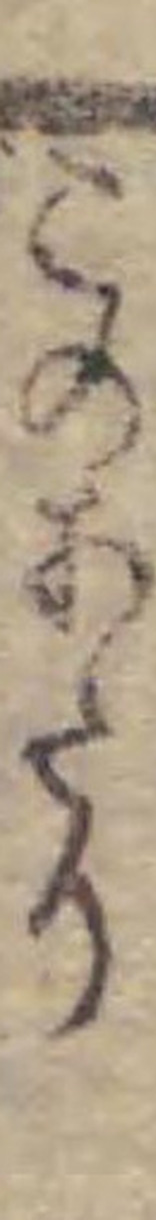このあたり
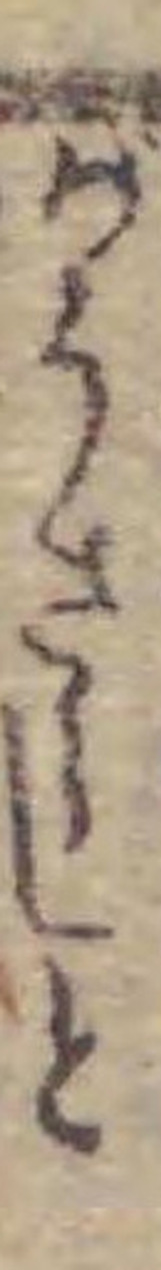がうさらしと
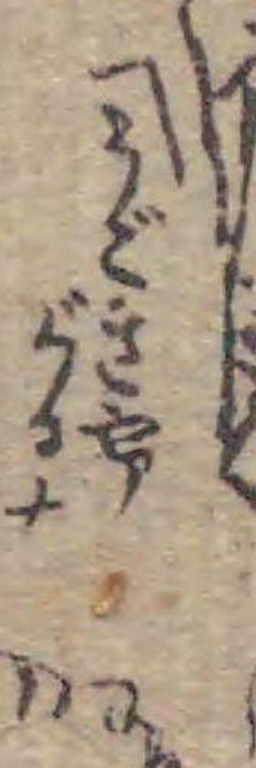〽うごきやァ
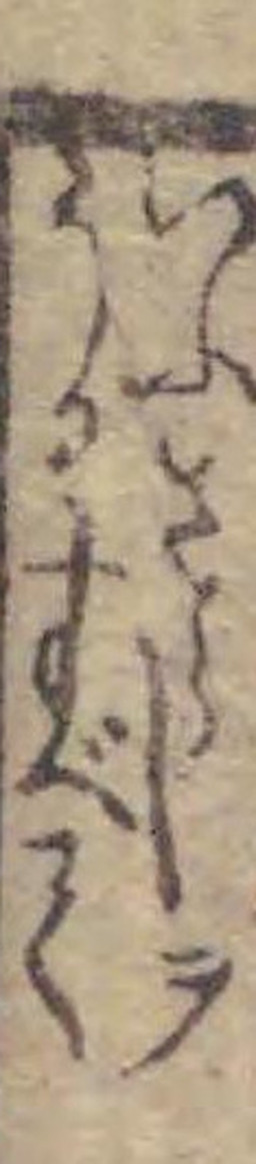うるすべて
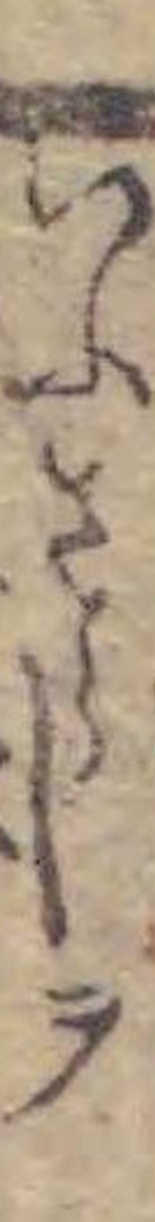いふさらしを
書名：北国順礼唄方便 : 3巻
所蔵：国立国会図書館 National Diet Library, JAPAN
